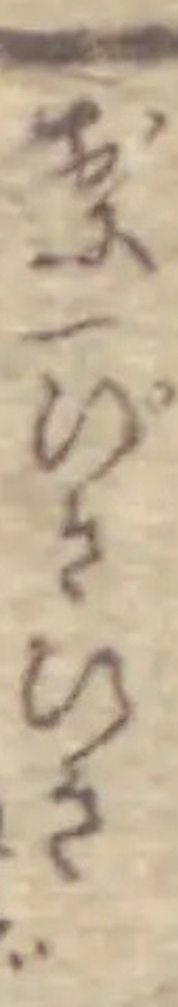おに一ぴきひきまど
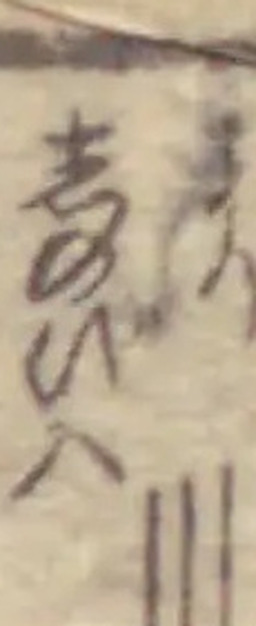しのび入
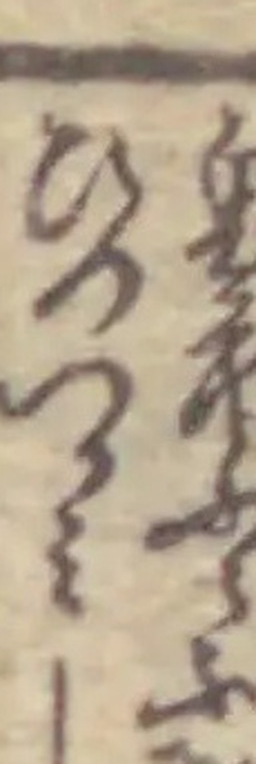ひつつかみ
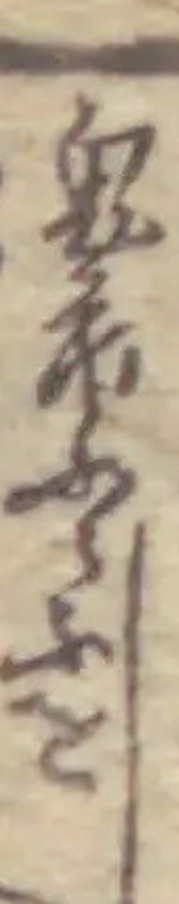鬼市ふうふを
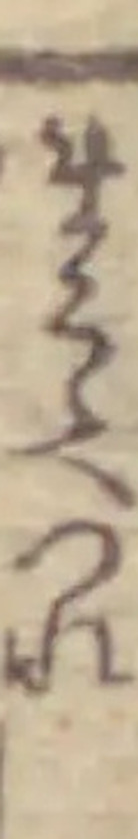まこくへつれ
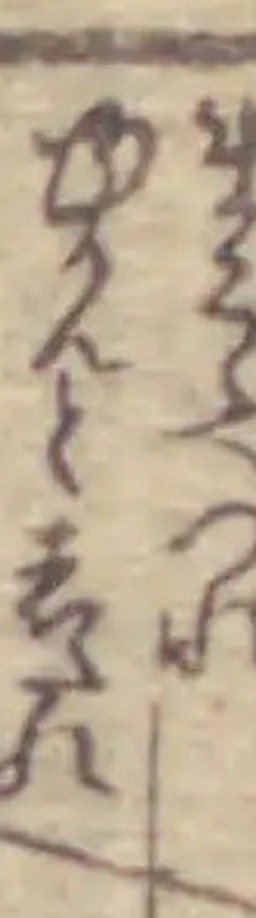ゆかんとしたれ
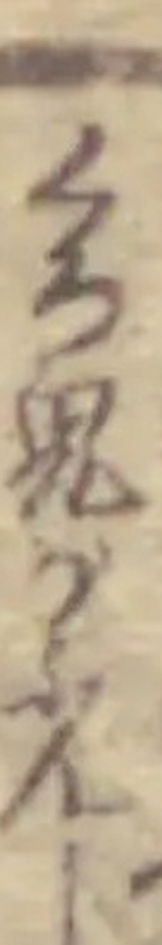くろ鬼がふん
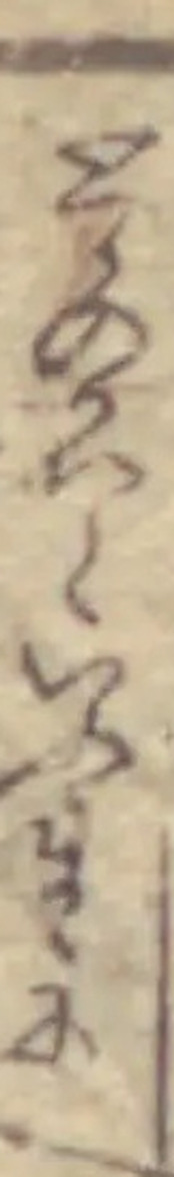とのかいといふまゝに
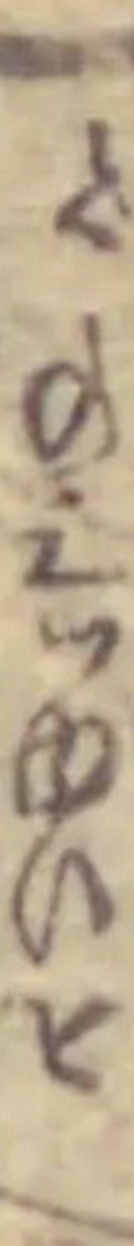どしの三つゆひを
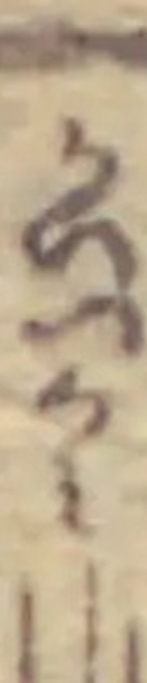かいつかみ
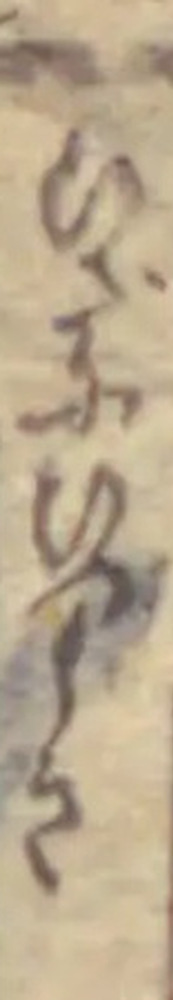ひざふひつしき
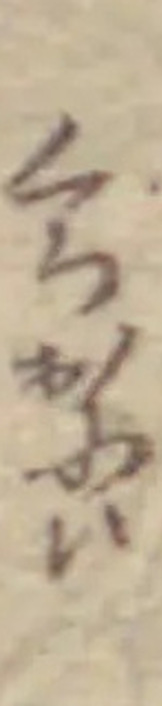くろおには
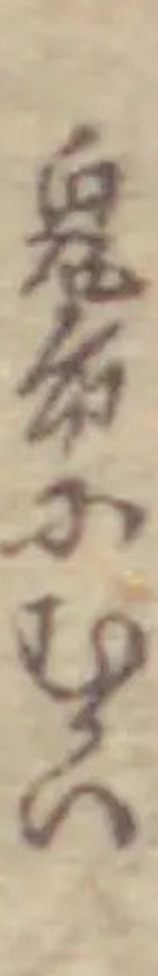鬼市にむかい
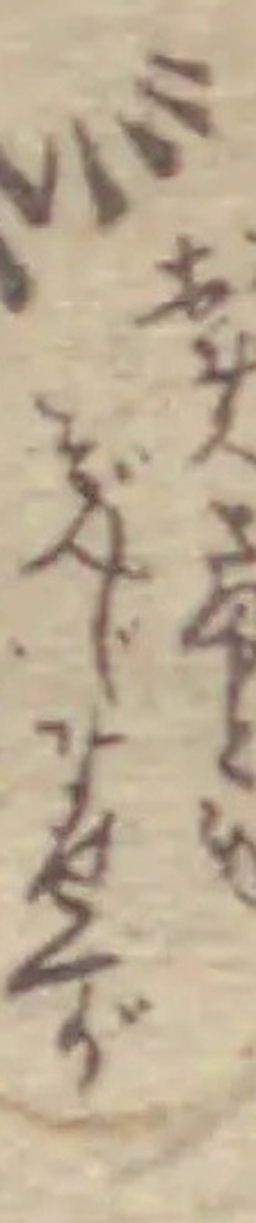ぞんじませず
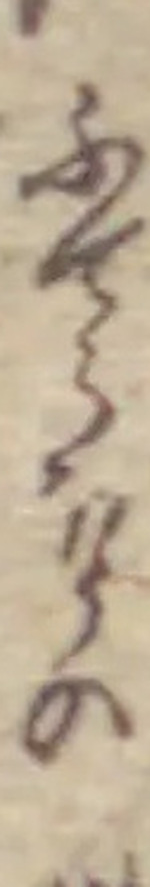ふてうほうの
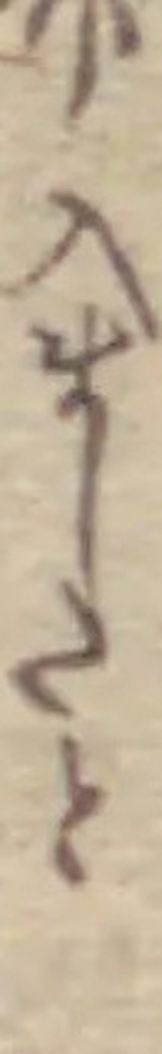入ましたと
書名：鬼子宝 3巻
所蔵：国立国会図書館 National Diet Library, JAPAN
